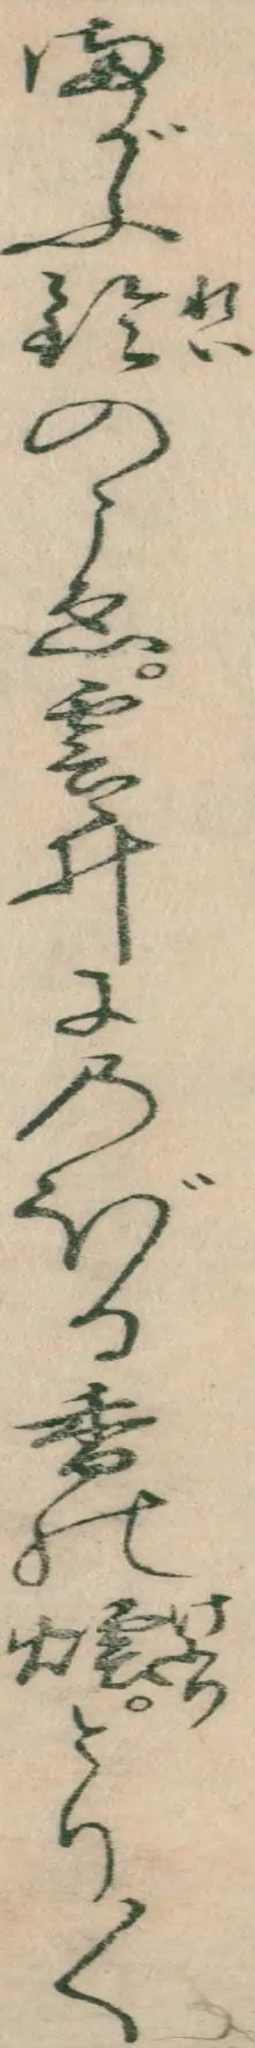まがふ鈴のこゑ。雲ゐにのぼる香の煙。とり〳〵
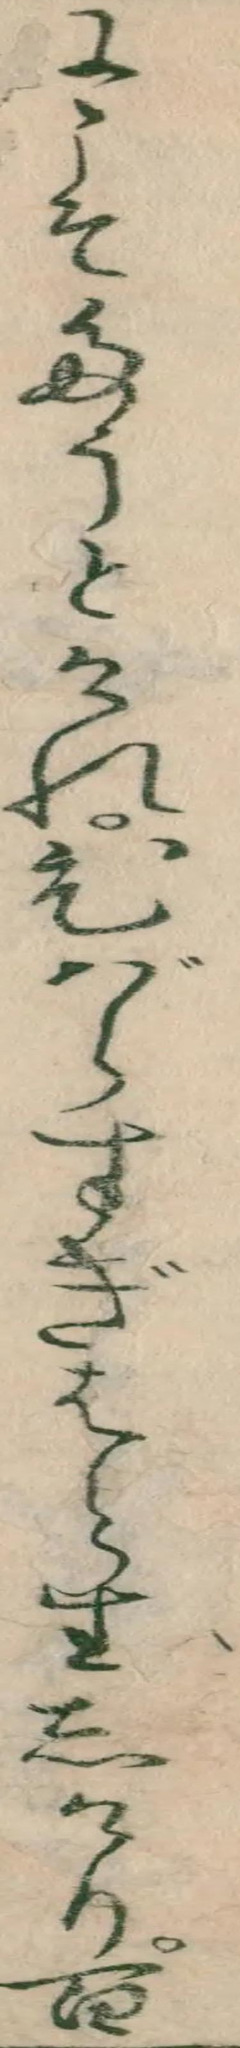にこそたうとけれ。ひばらすぎはら生しけり。百
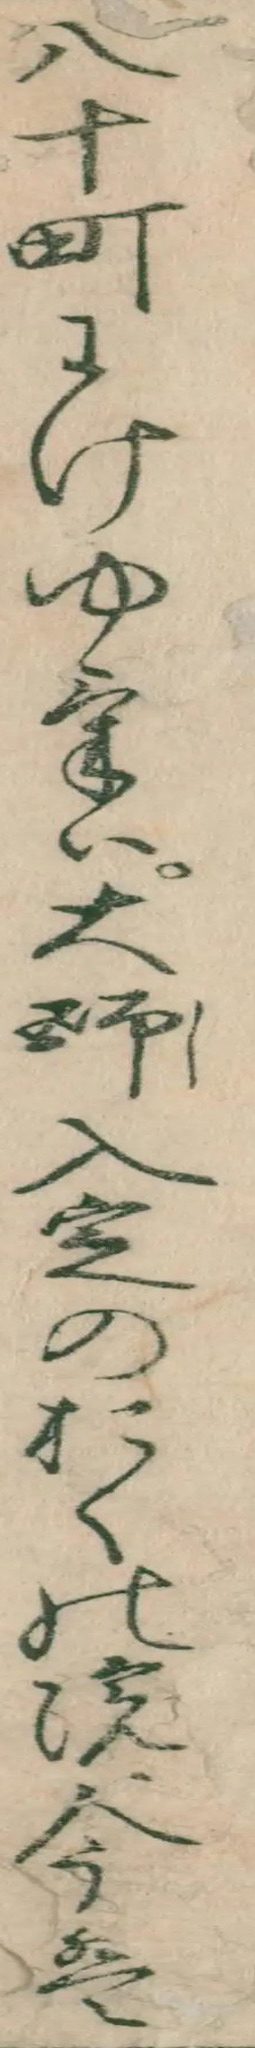八十町にけゆけは。大師入定のおくの院。今は
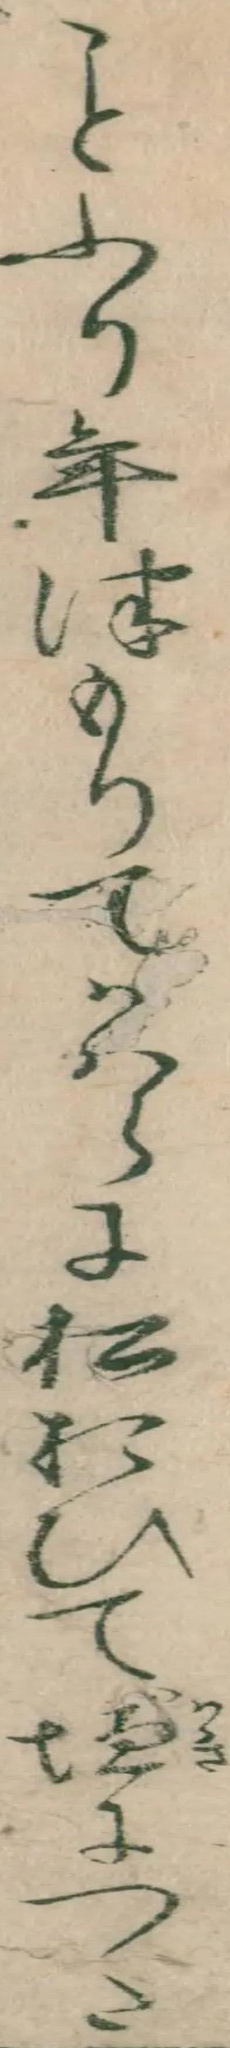ことふり年つもりてかはらに松おひて垣につた

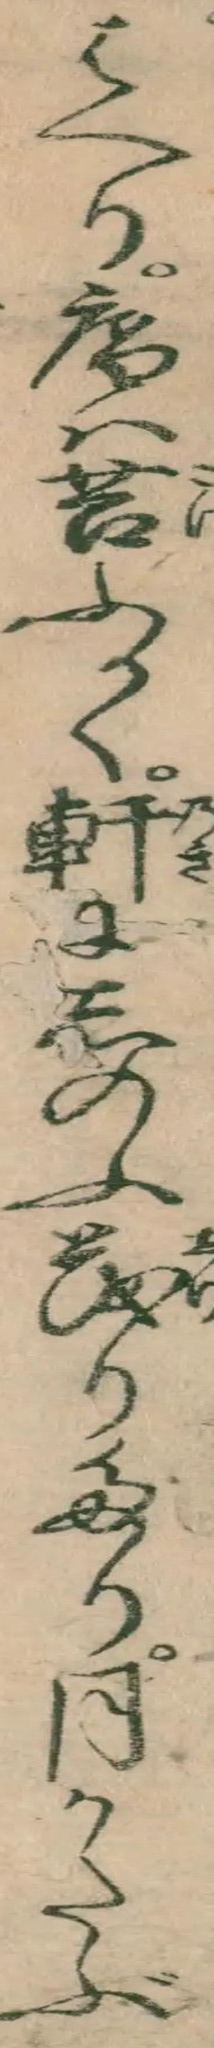はへり。席は苔ふかく。軒にしのふ茂りたり。月かたぶ
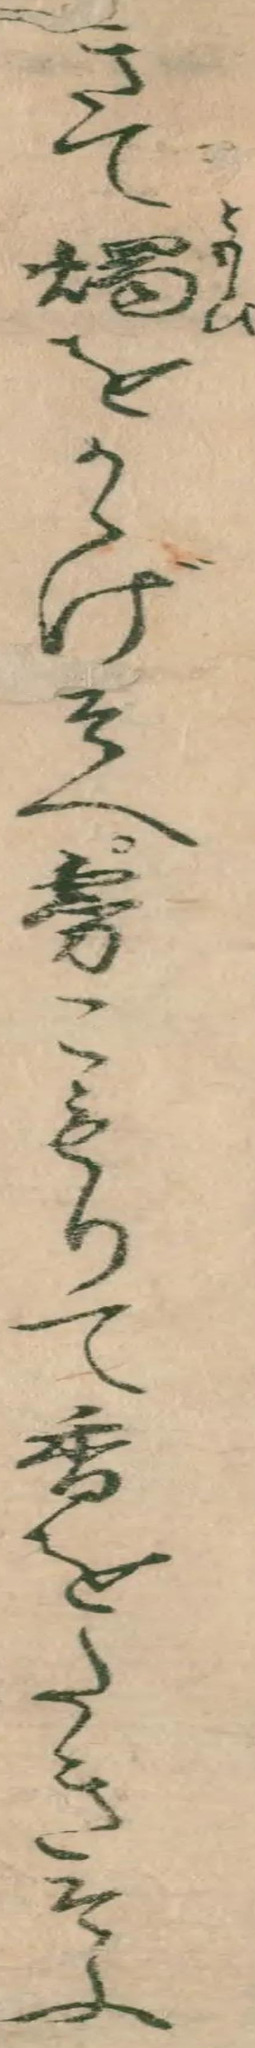きて。燭をかゝげそへ。霧こもりて香をたきそふ
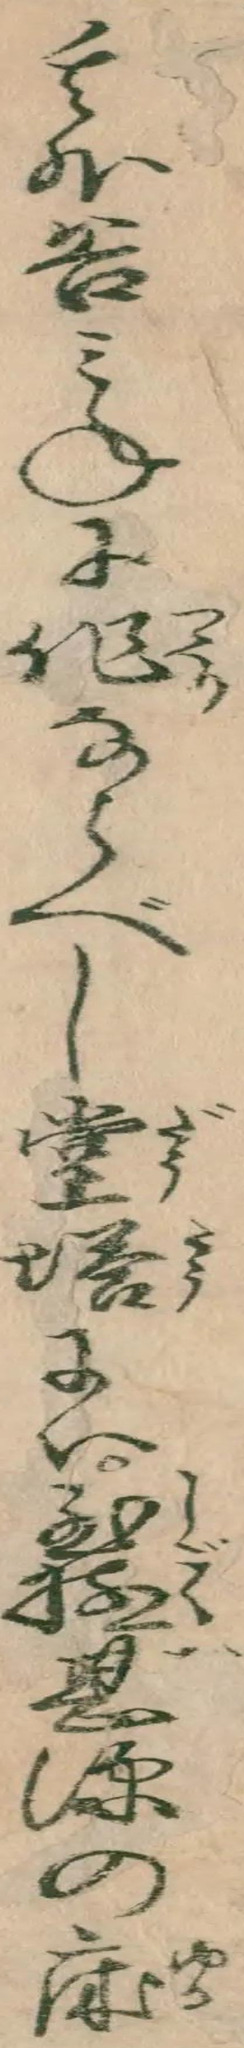其外谷みね作ならべし堂塔には。至極堪深の床
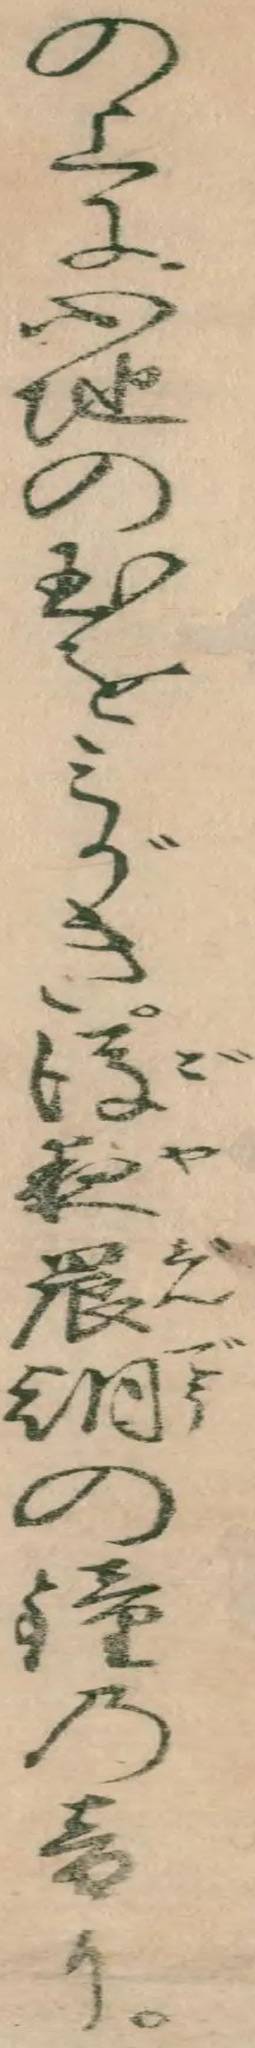の上に。心地の玉をみがき。後夜晨朝の鐘の音に。
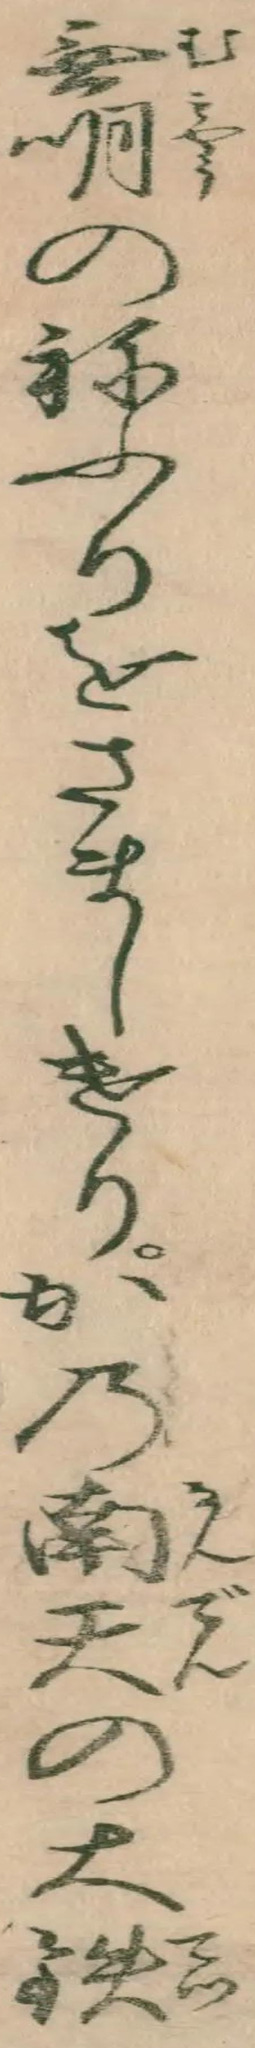無明のねふりをさましけり。かの南天の大鉄
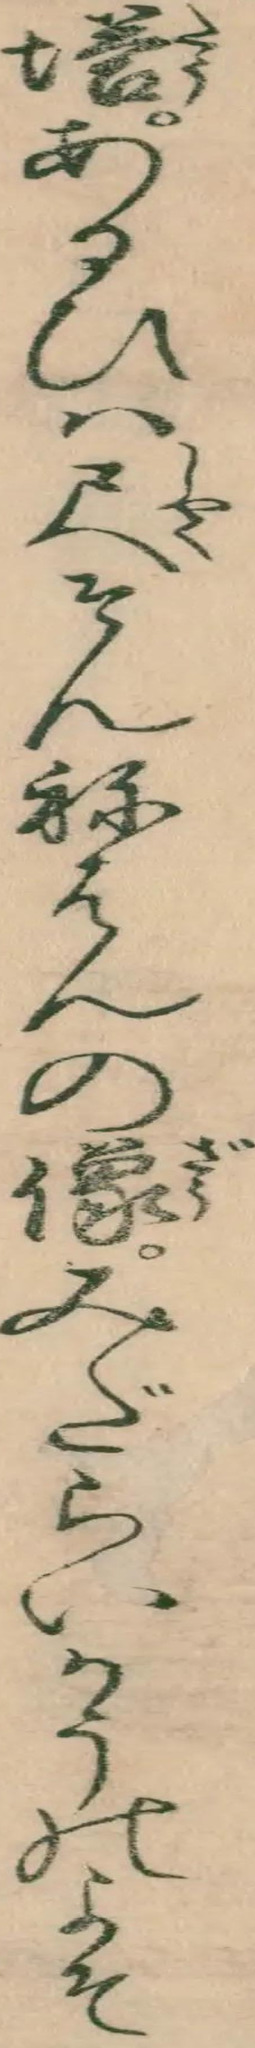塔。あるひは尺そんねはんの像。みだらいかうのよそ
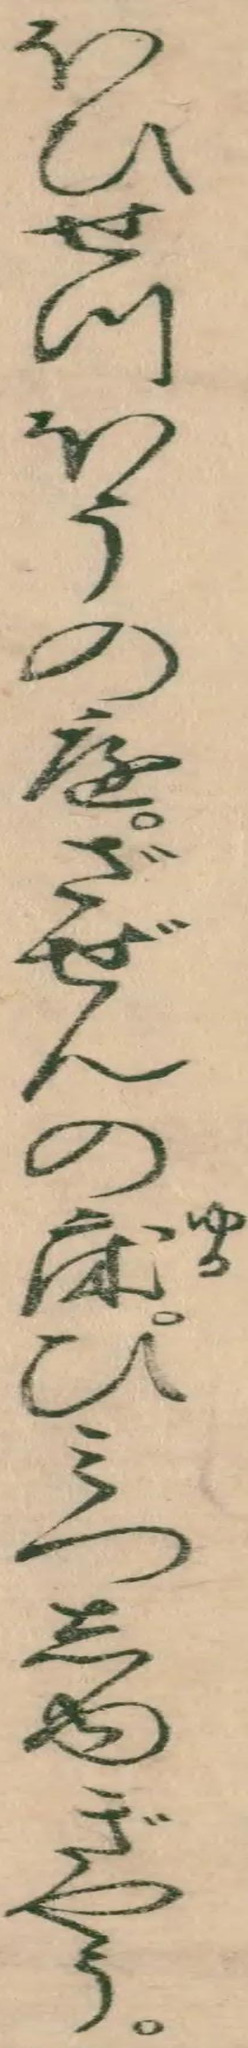ほひせつほうの庭。ざぜんの床ひみつしゆぎやう。
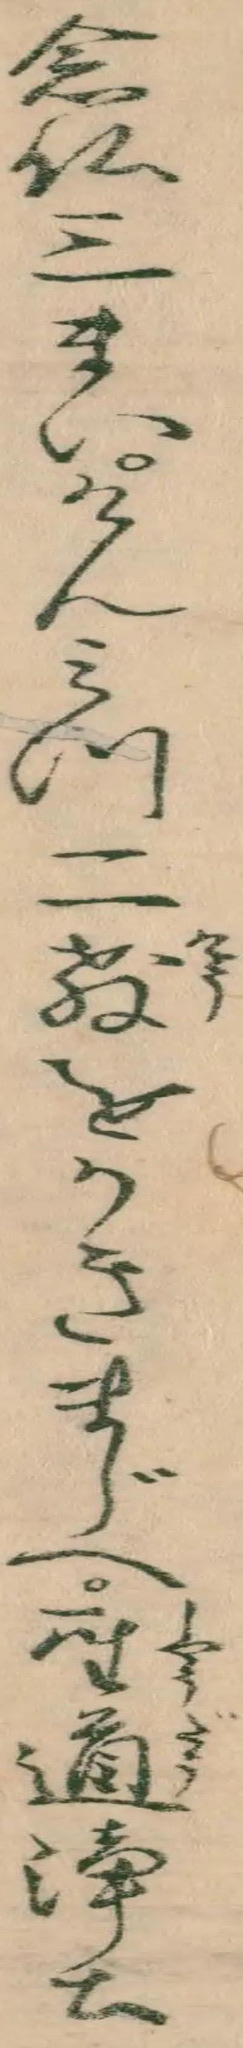念仏三まい。けんみつ二教をかきまじへ。聖道浄土
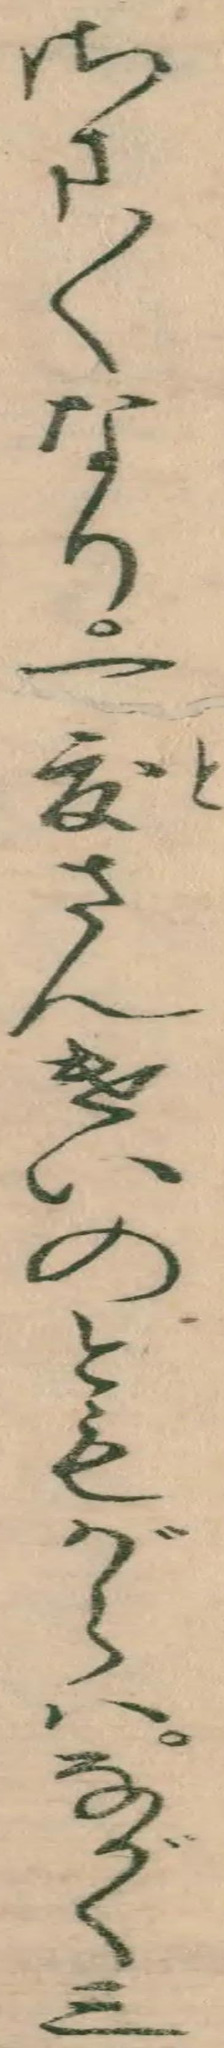さま〳〵なり。一度さんけいのともがらは、ながく三
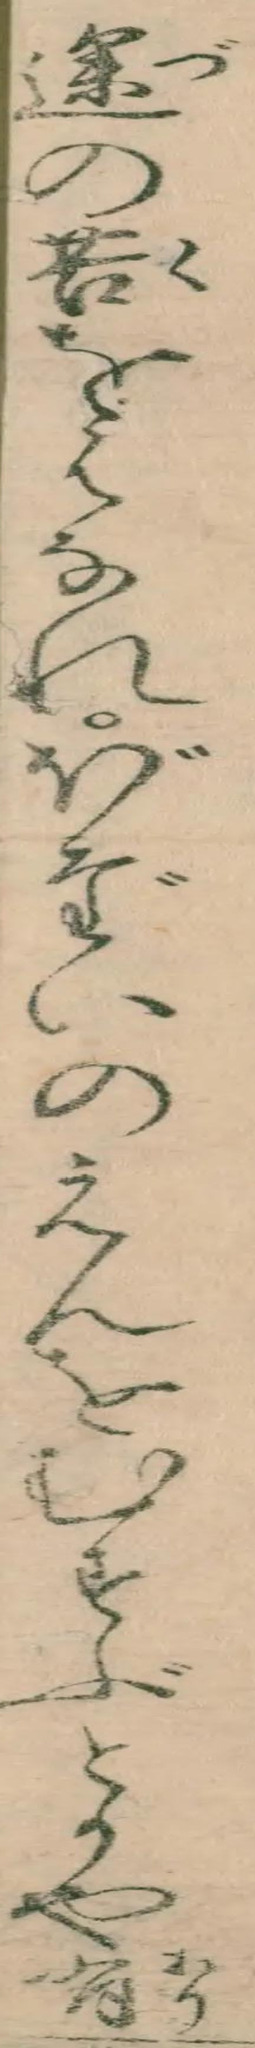途の苦をはなれ。ぼだいのえんをむすぶとかや有

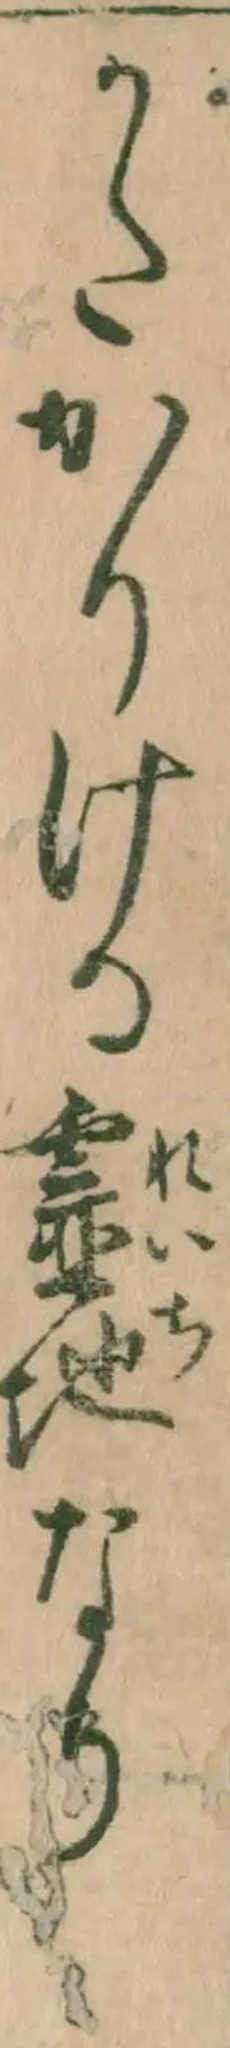がたりける霊地なり
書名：弘法大師御本地 3巻. [3]
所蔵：国立国会図書館 National Diet Library, JAPAN
